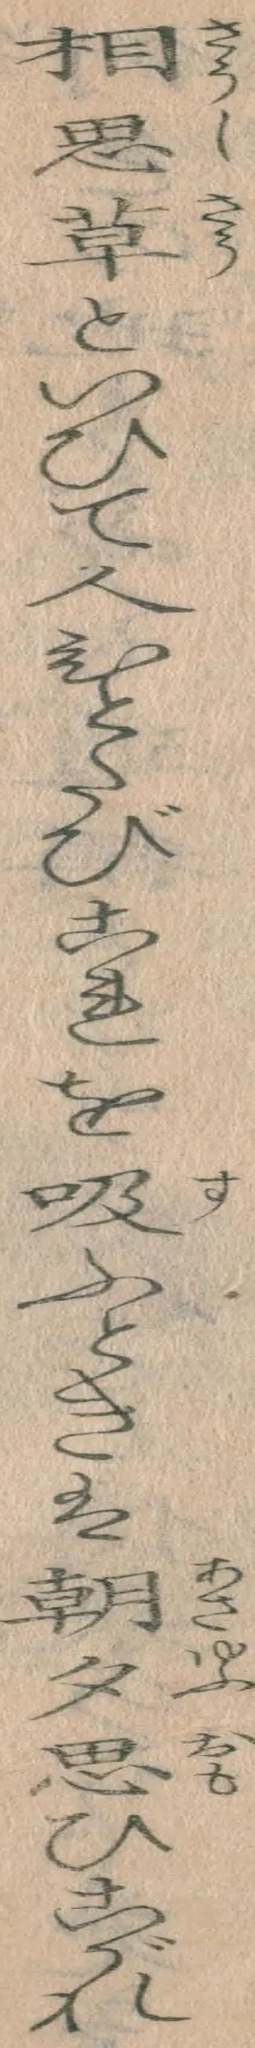相思草といひて人ひとたびこれを吸ふときは朝夕思ひこがれ
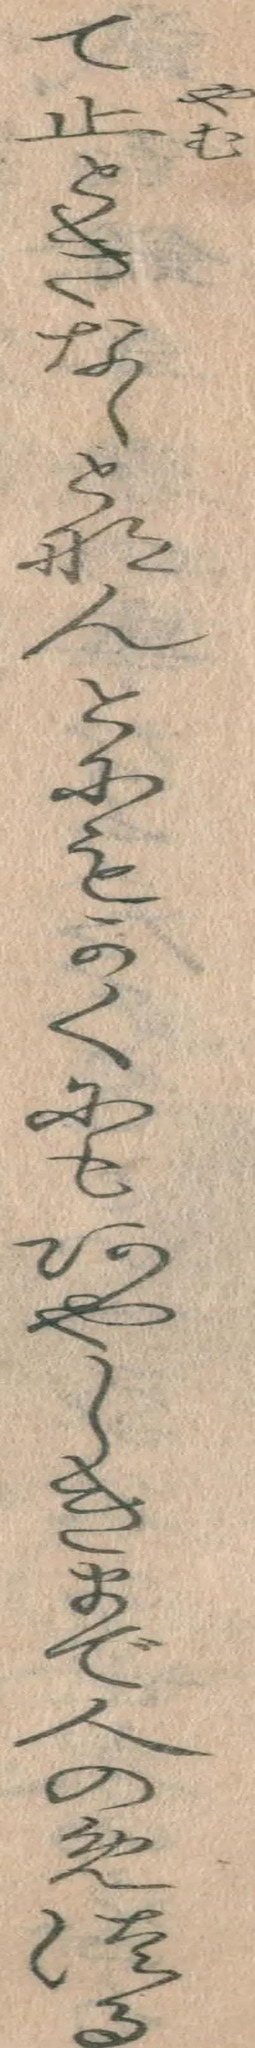て止ときなしとなんとにもかくにもあやしきまで人のめつる
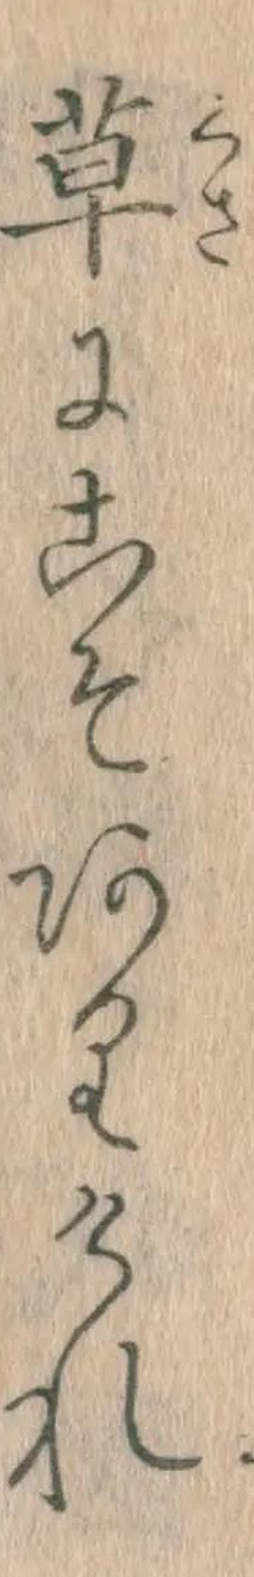草にこそありけれ
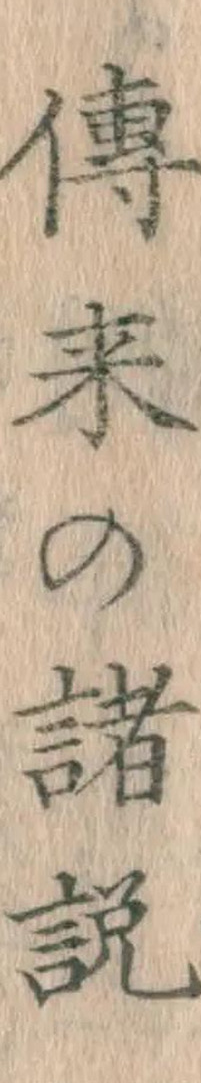伝来の諸説
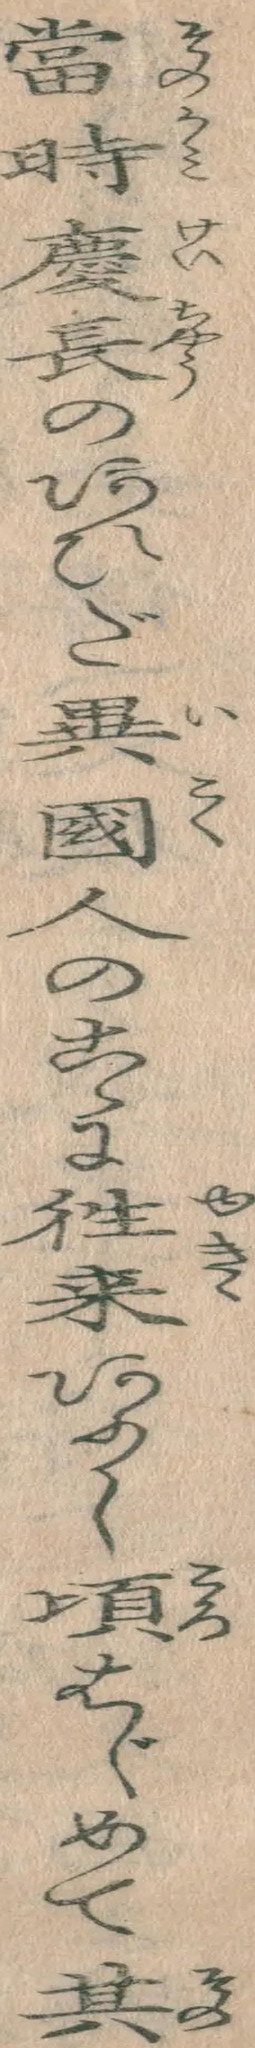当時慶長のあひだ異国人のこゝに往来ありし頃はじめて其
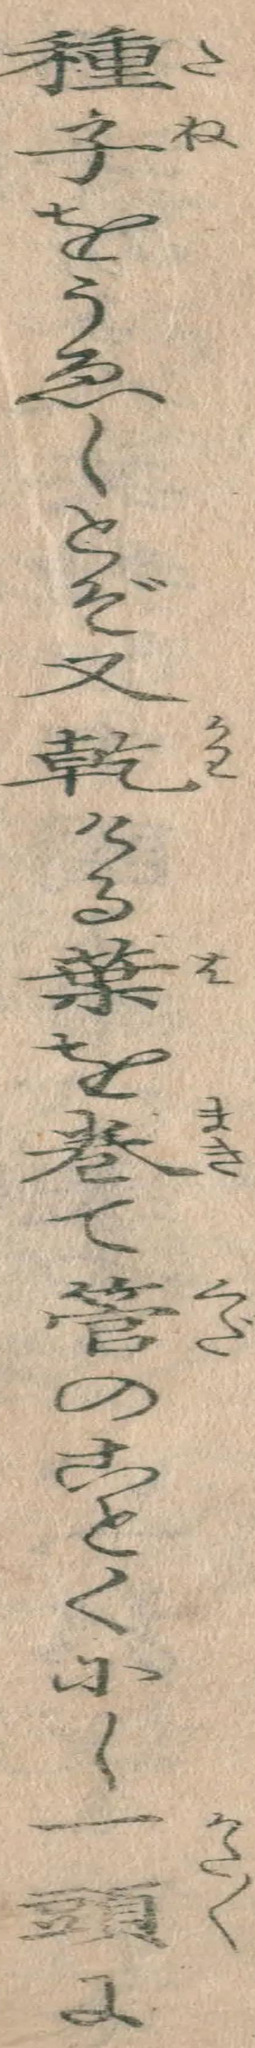種子をうゑしとぞ又乾ける葉を巻て管のことくにし一頭に
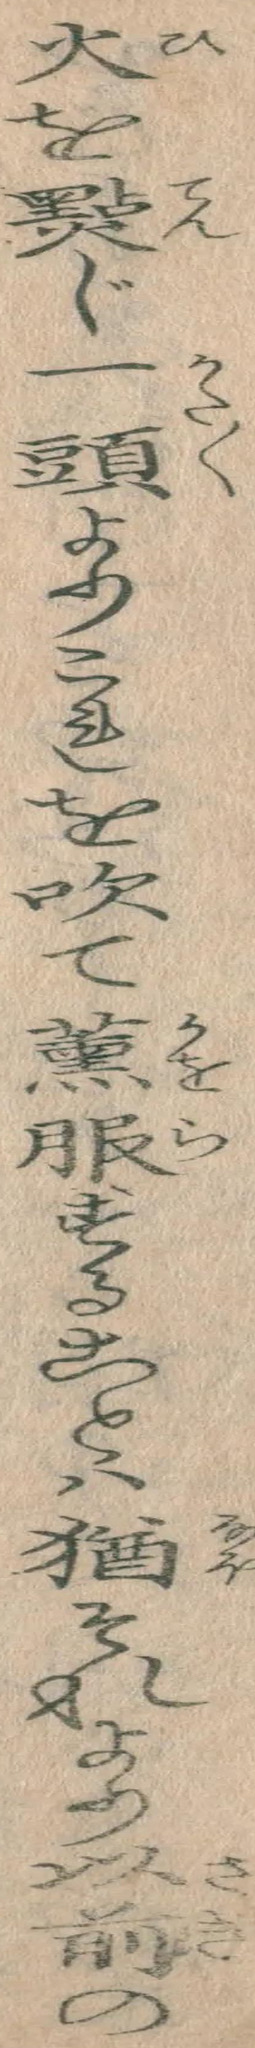火を点じ一頭よりこれを吹て薫服することは猶それより以前の
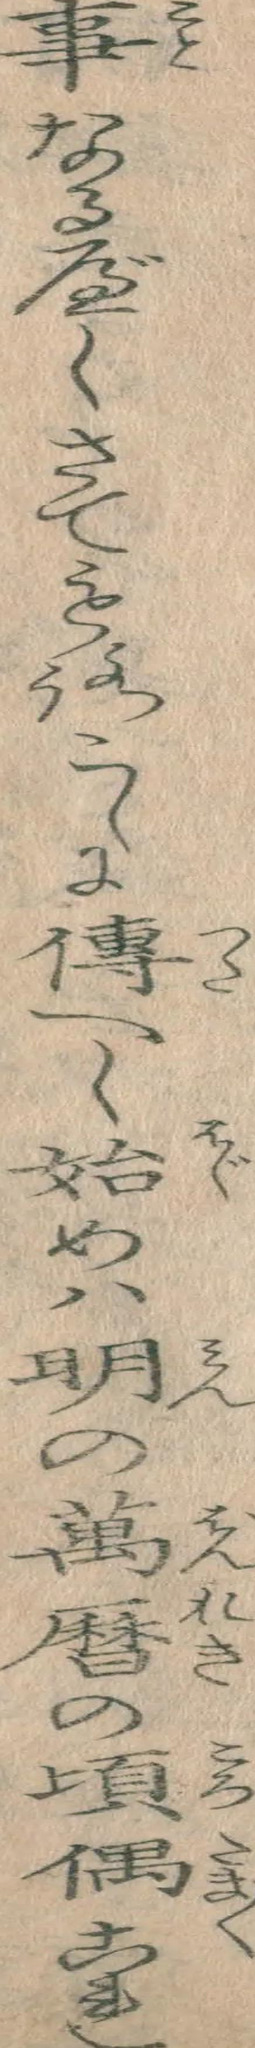事なるべしさてもろこしに伝へし始めは明の万暦の頃偶これ
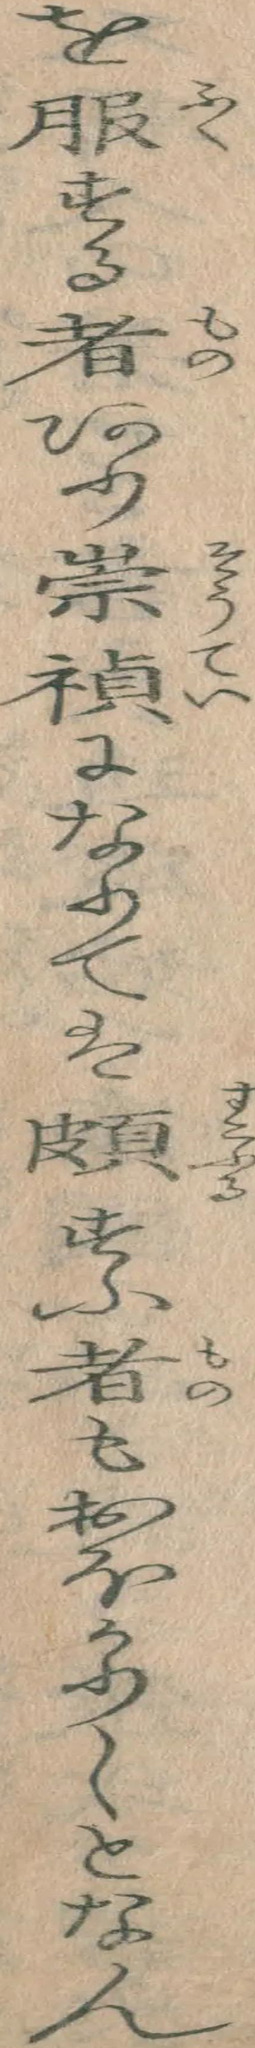を服する者あり崇禎になりては頗すふ者もおほかりしとなん

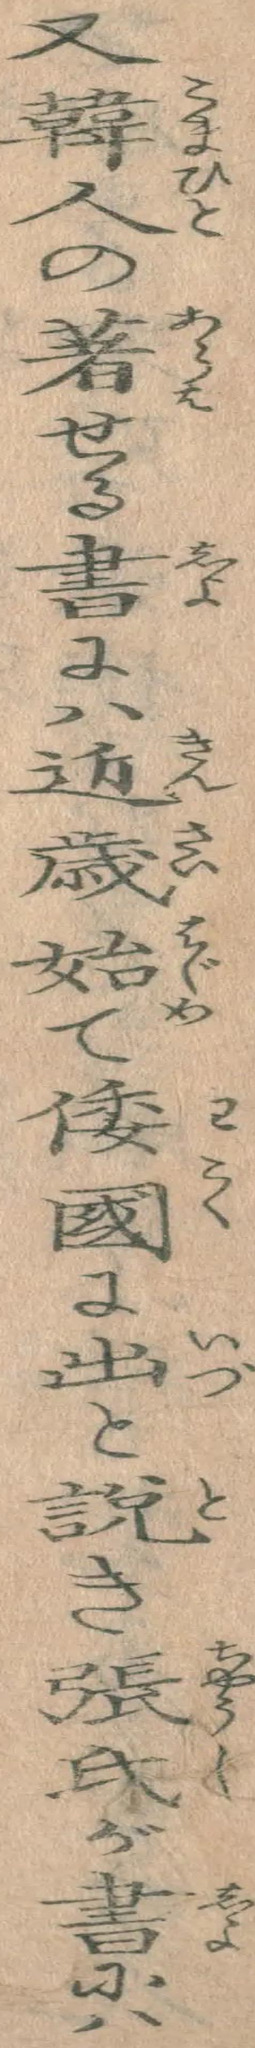又韓人の著せる書には近歳始て倭国に出と説き張氏が書には
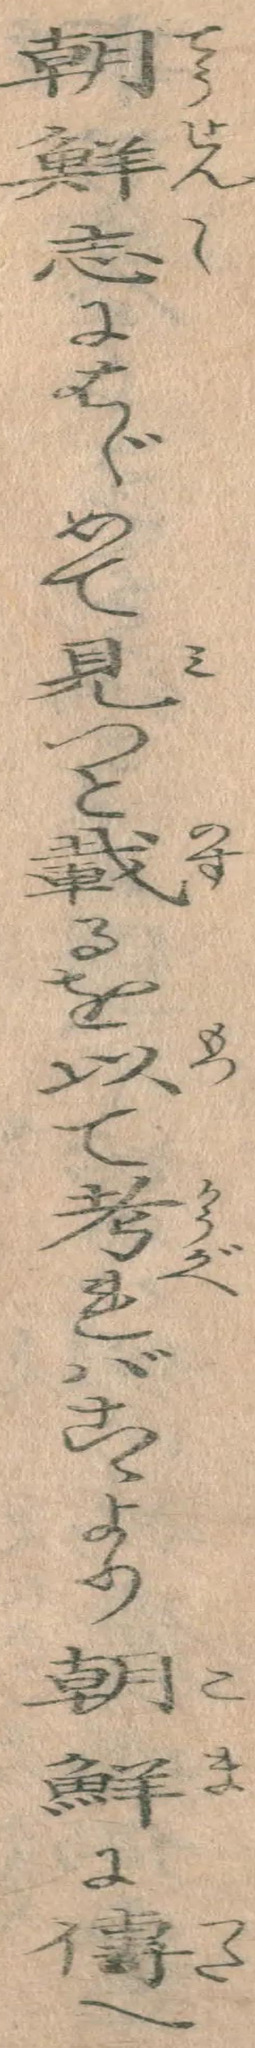朝鮮志にはじめて見つと載るを以て考ればこゝより朝鮮に伝へ
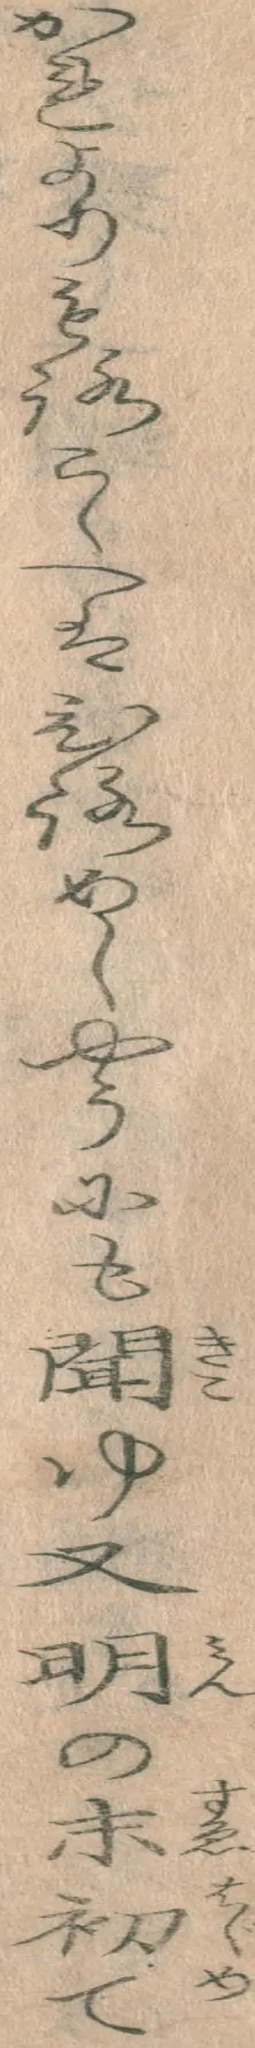かれよりもろこしへはひろめしやうにも聞ゆ又明の末初て
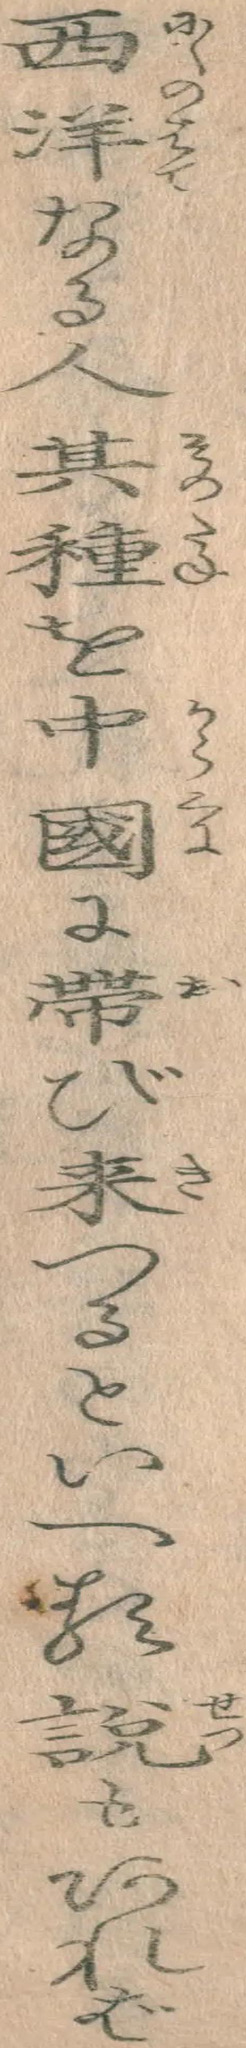西洋なる人其種を中国に帯び来つるといへる説もあれば
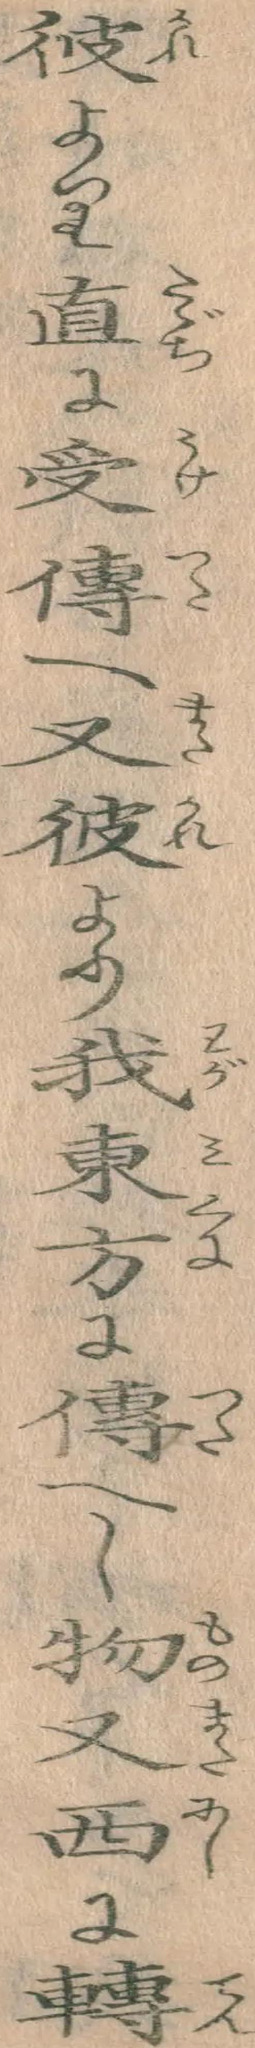彼より直に受伝へ又彼より我東方に伝へし物又西に転
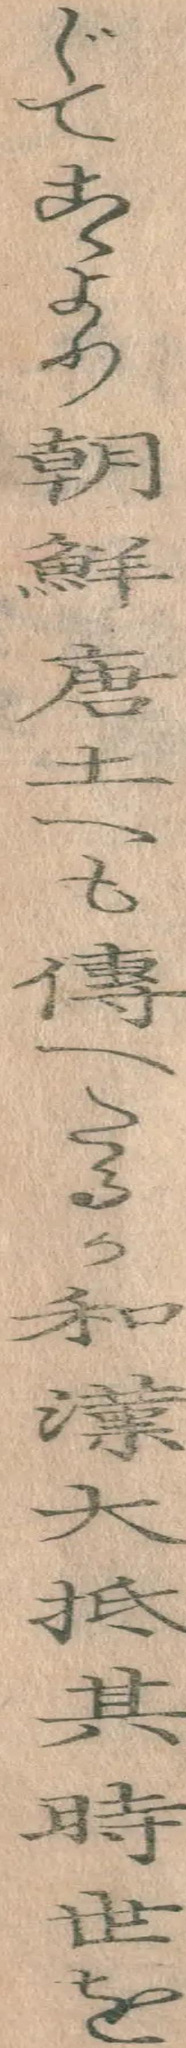じてこゝより朝鮮唐土へも伝へたるか和漢大抵其時世を
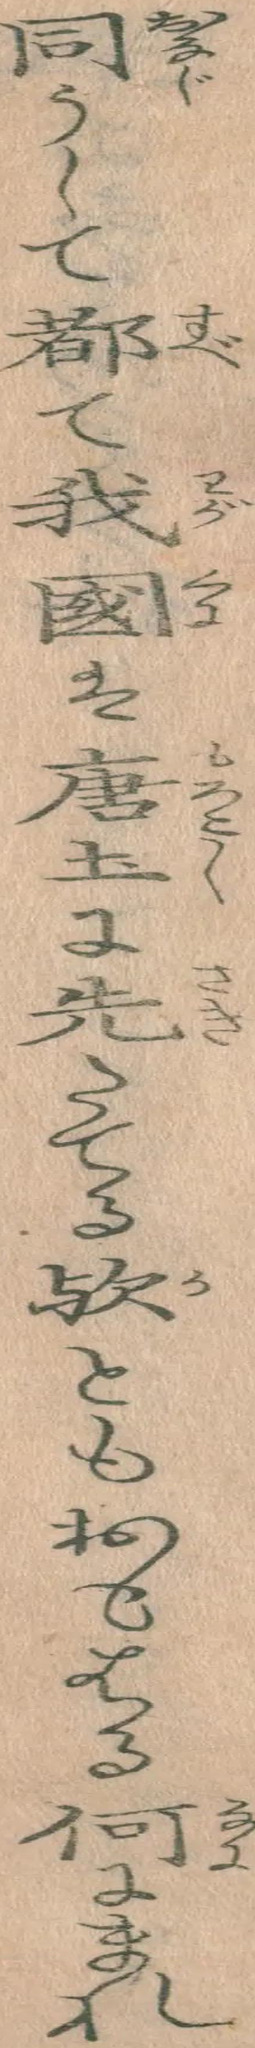同うして都て我国は唐土に先たてる歟ともおもはる何にまれ
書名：目さまし草
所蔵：国立国会図書館 National Diet Library, JAPAN
